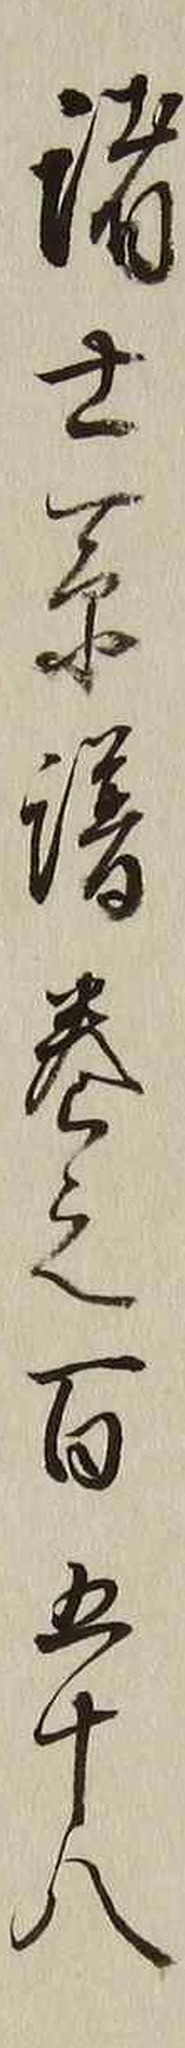諸士系譜巻之百五十八
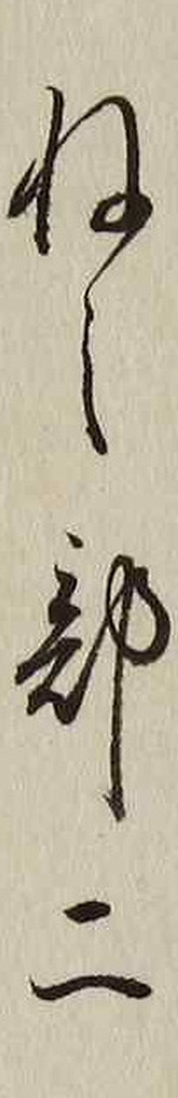ね之部二
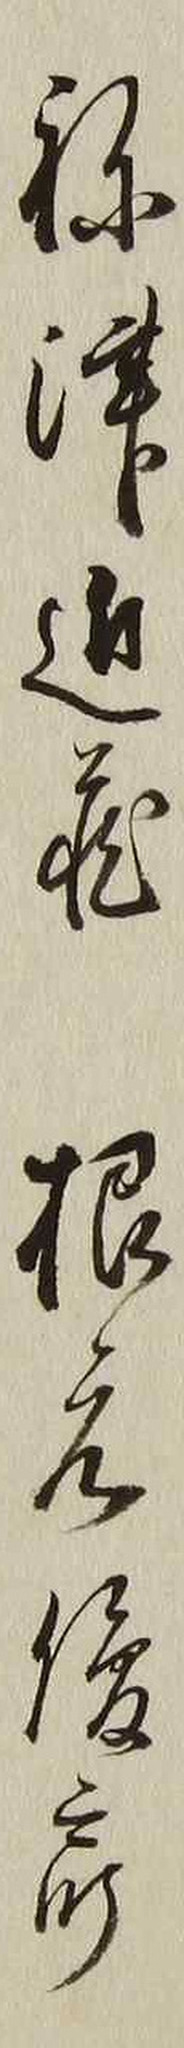禰津近蔵根元俊郎
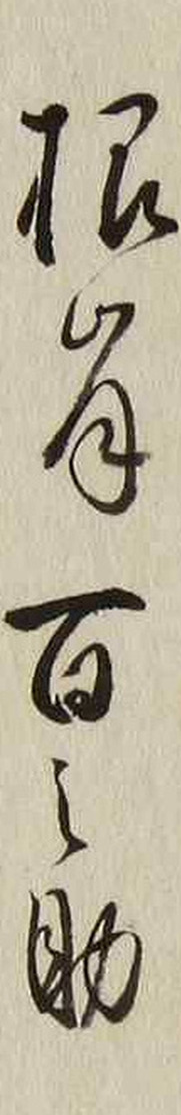根岸百之助

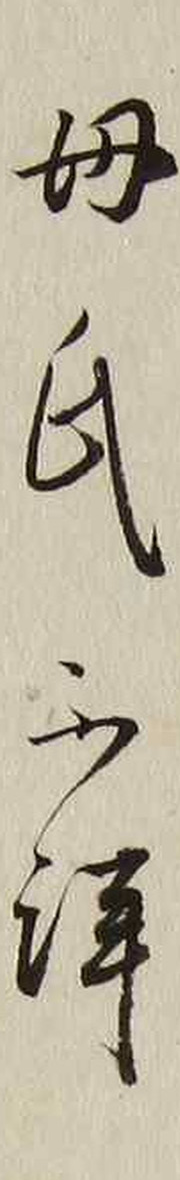母氏不詳
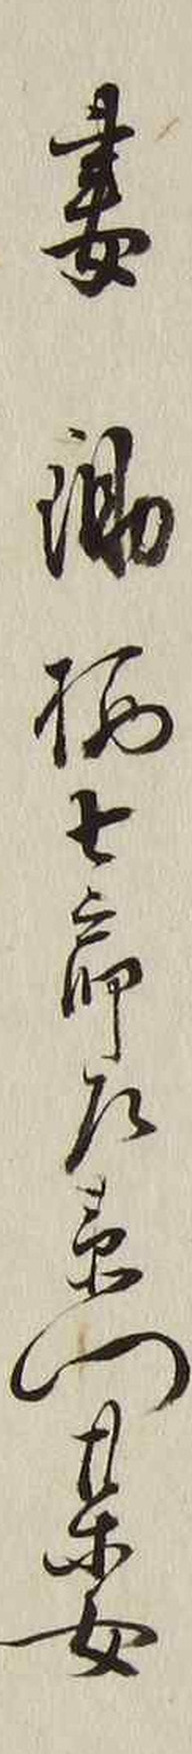妻鋤柄七郎左衛門某女

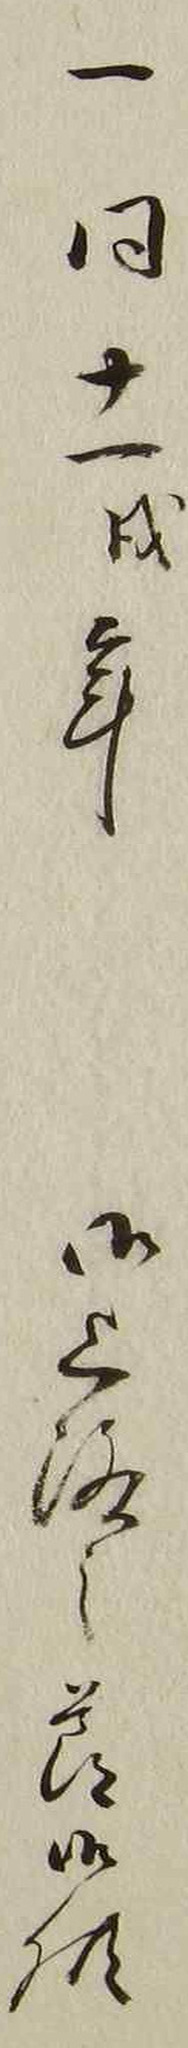一同十一戌年御上洛之節御供
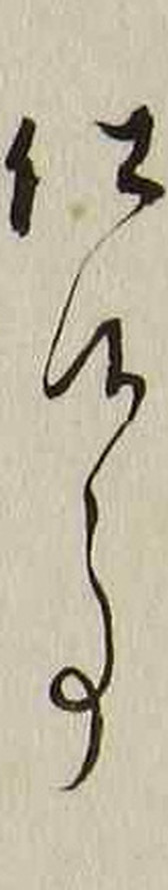仕候事
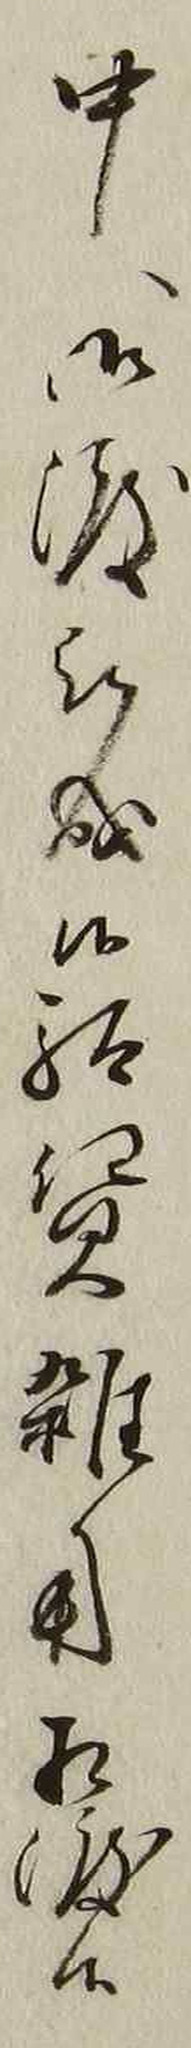中へ御渡被成候駄賃雑用相渡候
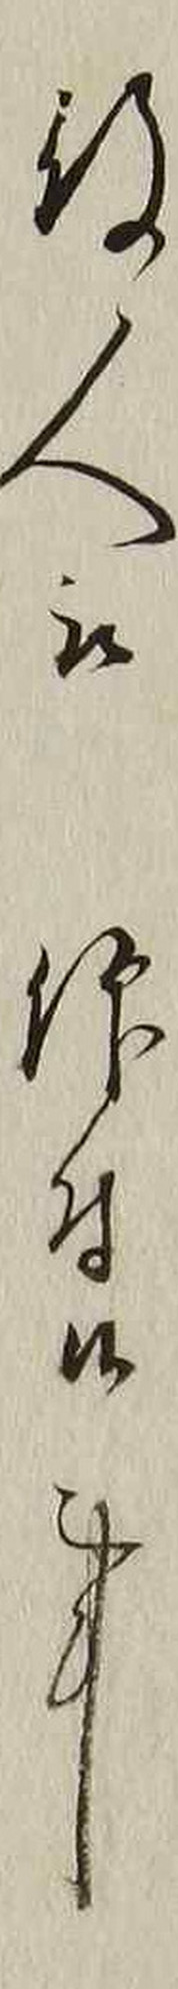役人被仰付候事
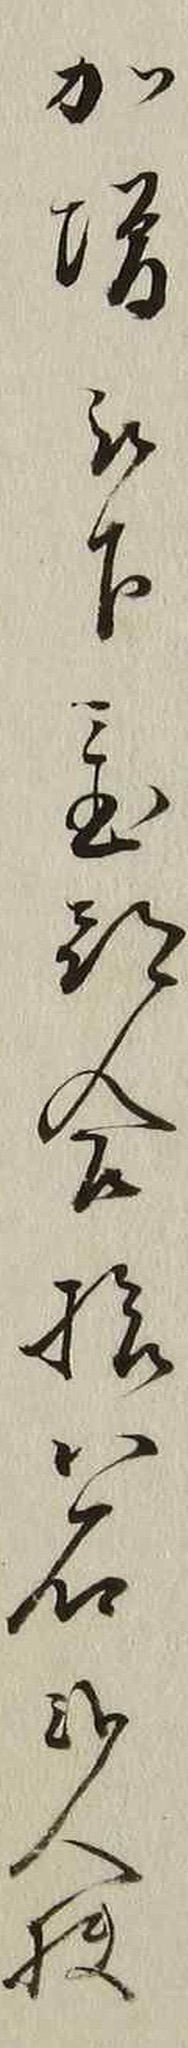加増被下置都合拾八石弐人扶
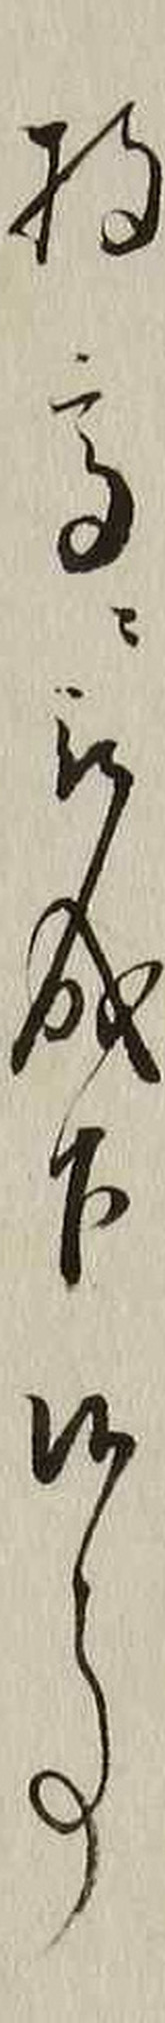持髙に被成下候事
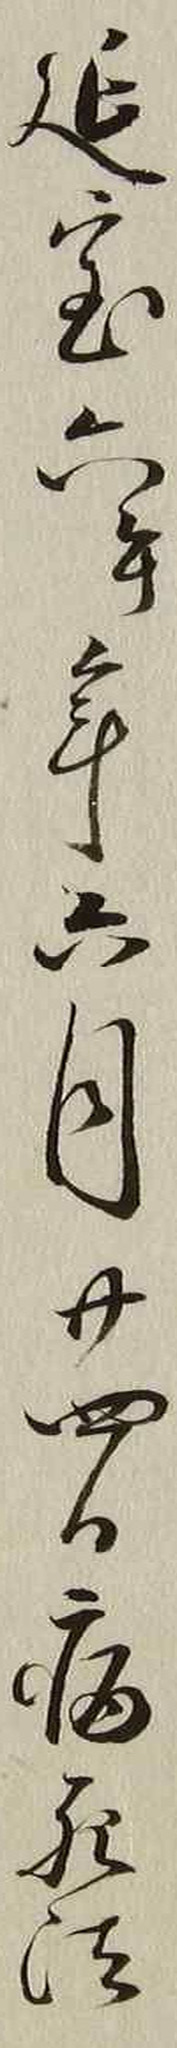延宝六午年六月廿四日病死法
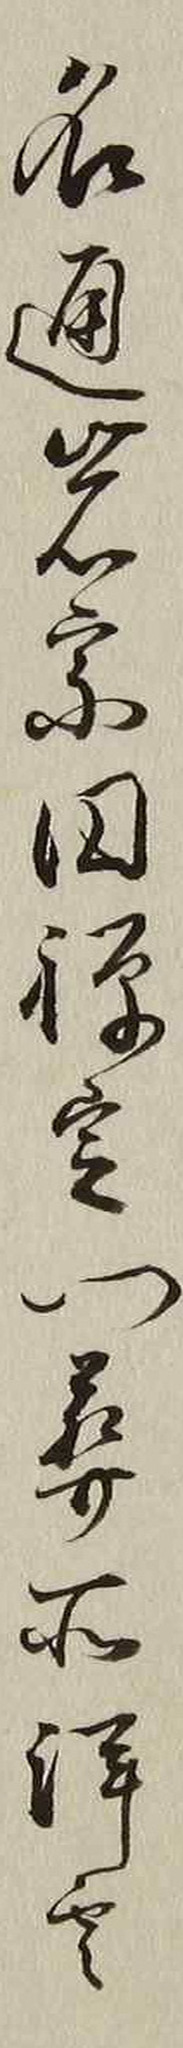名通岩宗円禅定門葬所祥雲
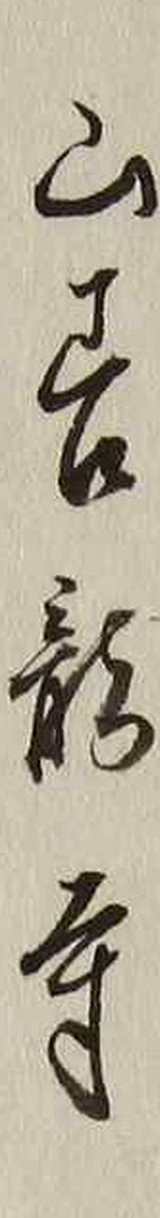山善竜寺
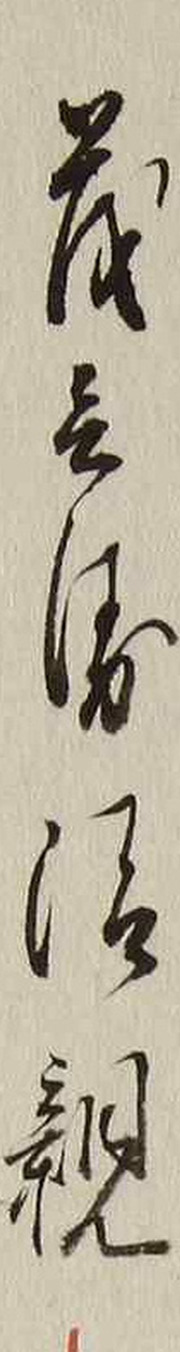茂兵衛清親
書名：諸士系譜　巻之158　ね之部2
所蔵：会津若松市立会津図書館
